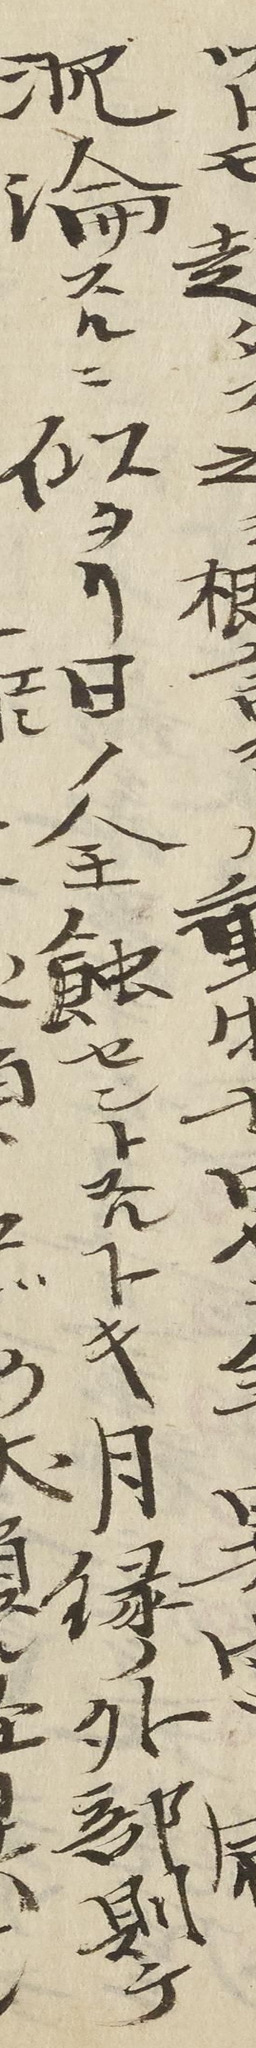況論スルニ似タリ日ノ全蝕セントスルトキ月縁ノ外部則チ
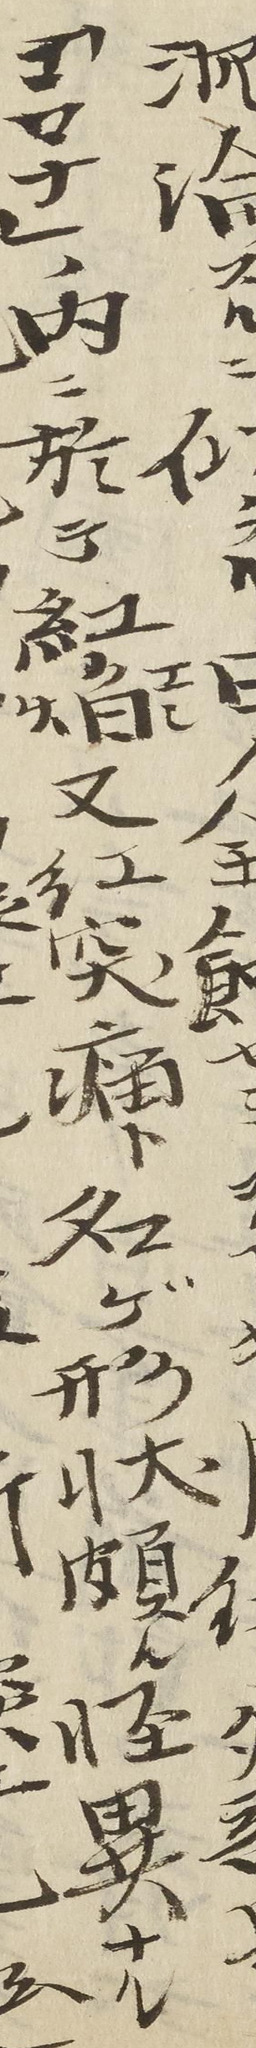「コロナ」ノ内に於テ紅焔又紅突瘤ト名ゲ形状頗ル怪異ナル
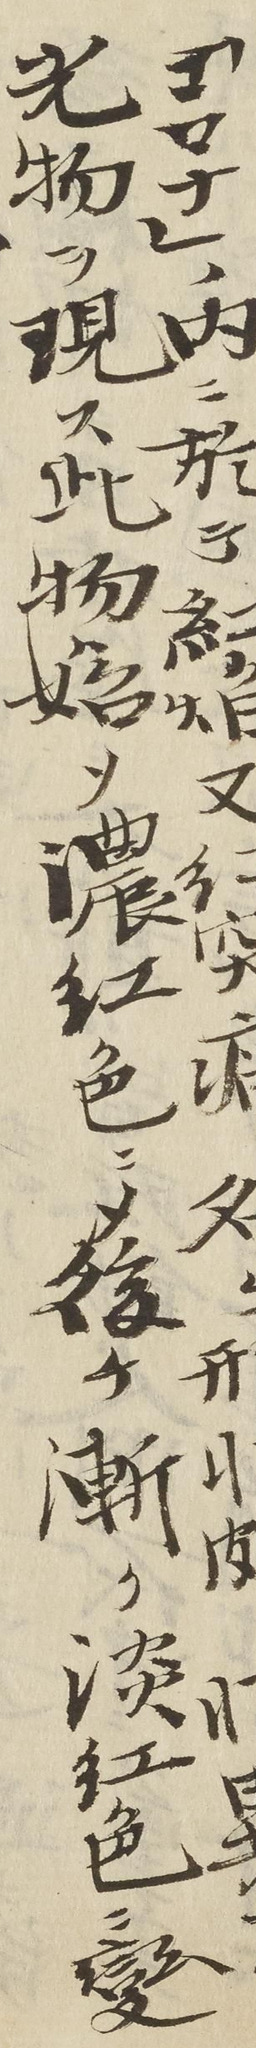光物ヲ現ス此物ハ始メ濃紅色ニシテ後チ漸ク淡紅色ニ変
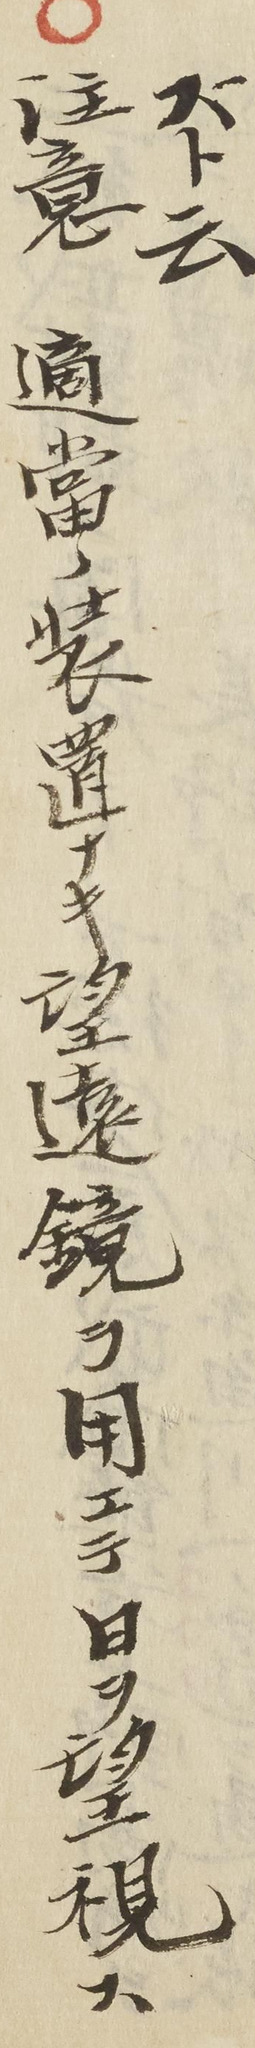○注意適当ノ装置ナキ望遠鏡ヲ用エテ日ヲ望視ス
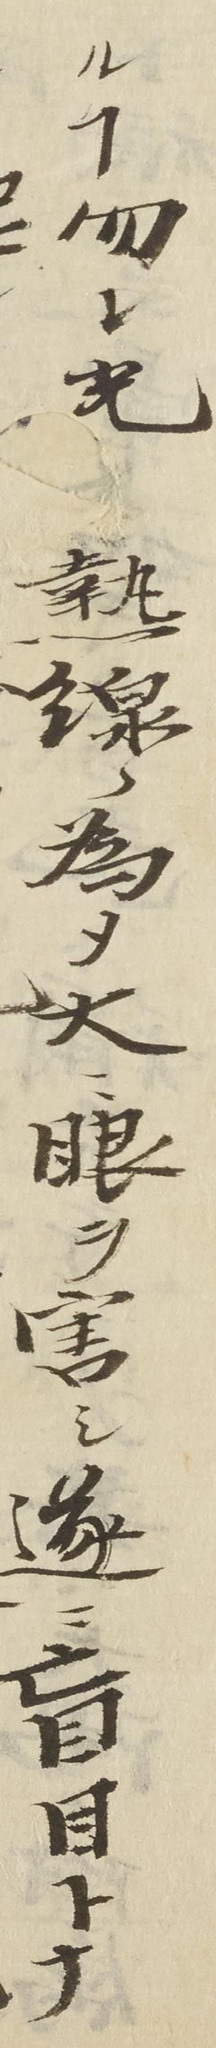ルコト勿レ光熱線ノ為メ大ニ眼ヲ害シ遂ニ盲目トナ
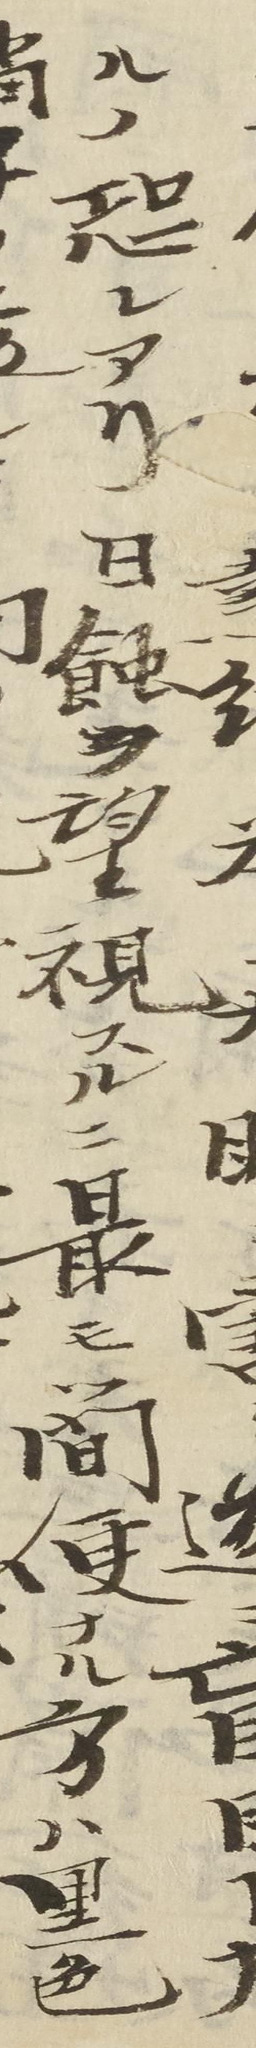ルノ恐レアリ日蝕ヲ望視スルニ最モ簡便ナル方ハ黒色
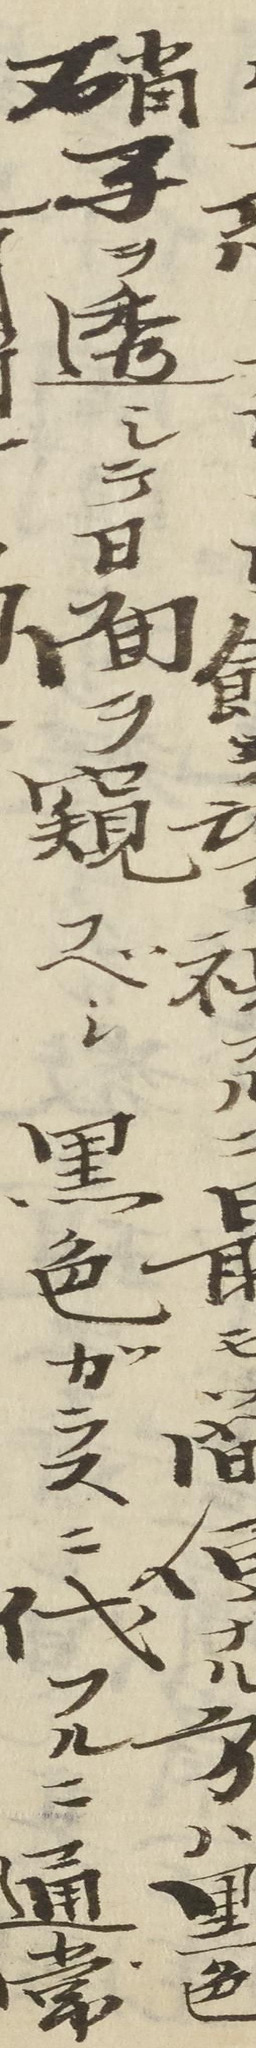硝子ヲ透シテ日面ヲ窺フベシ黒色ガラスニ代フルに通常
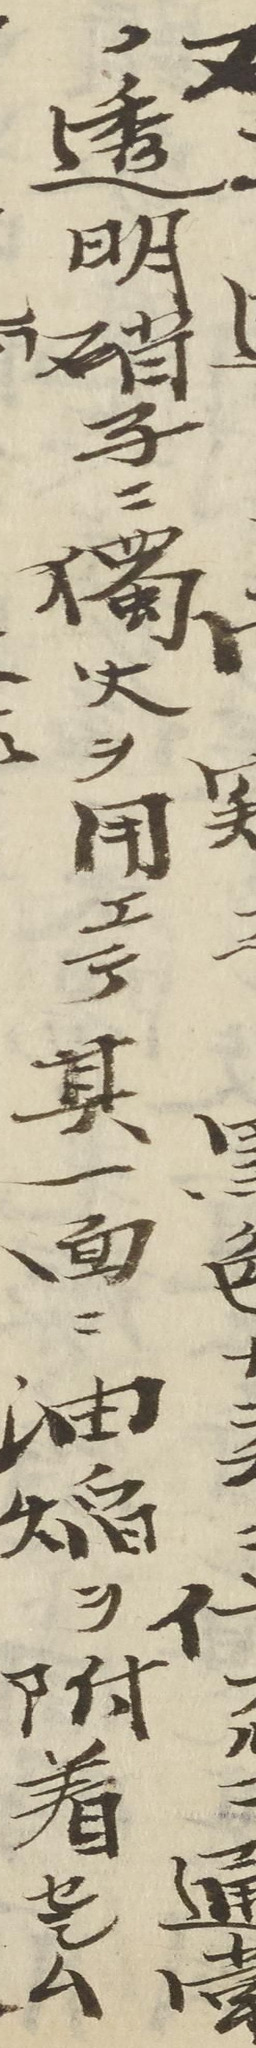ノ透明硝子ニ獨火ヲ用エテ其一面ニ油焰ヲ附着セシム
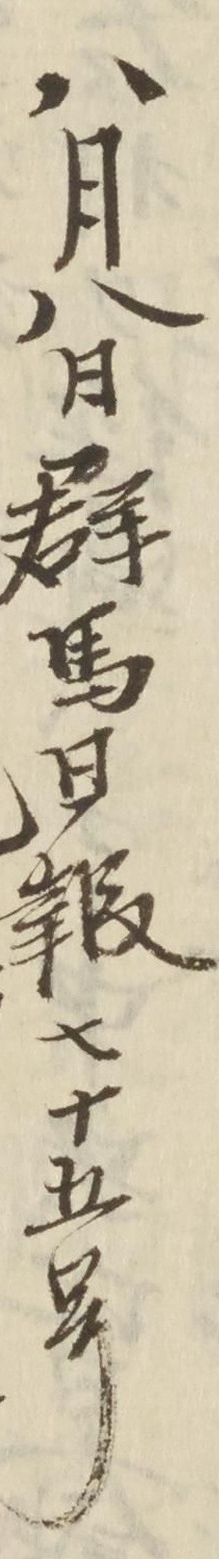八月八日群馬日報七十五号
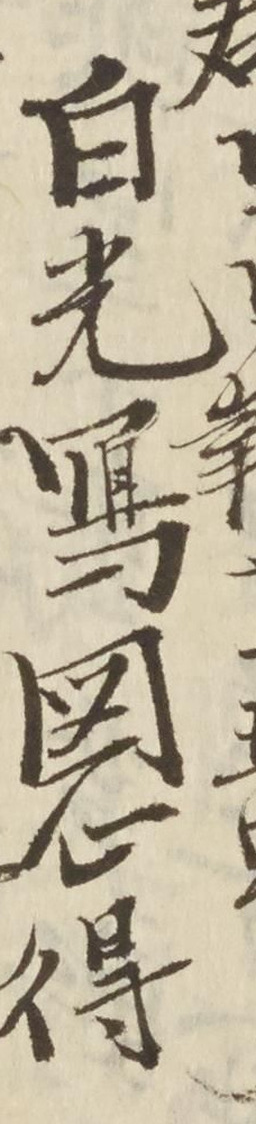白光写図心得
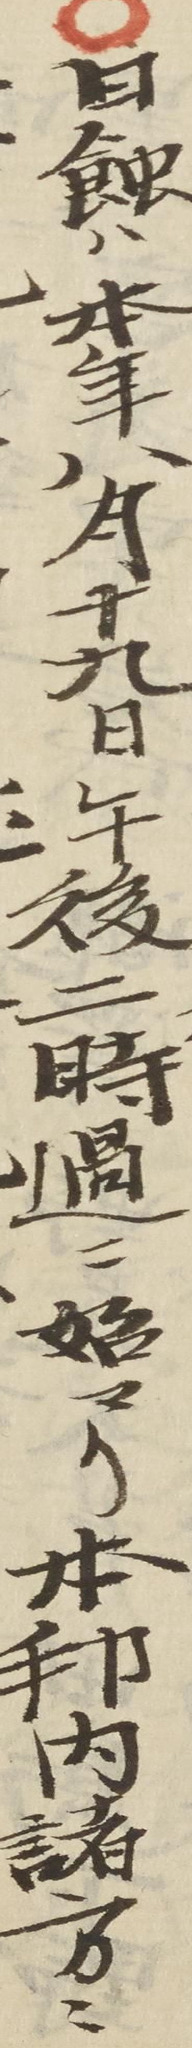○日蝕ハ本年八月十九日午後二時過ニ始マリ本邦内諸方ニ
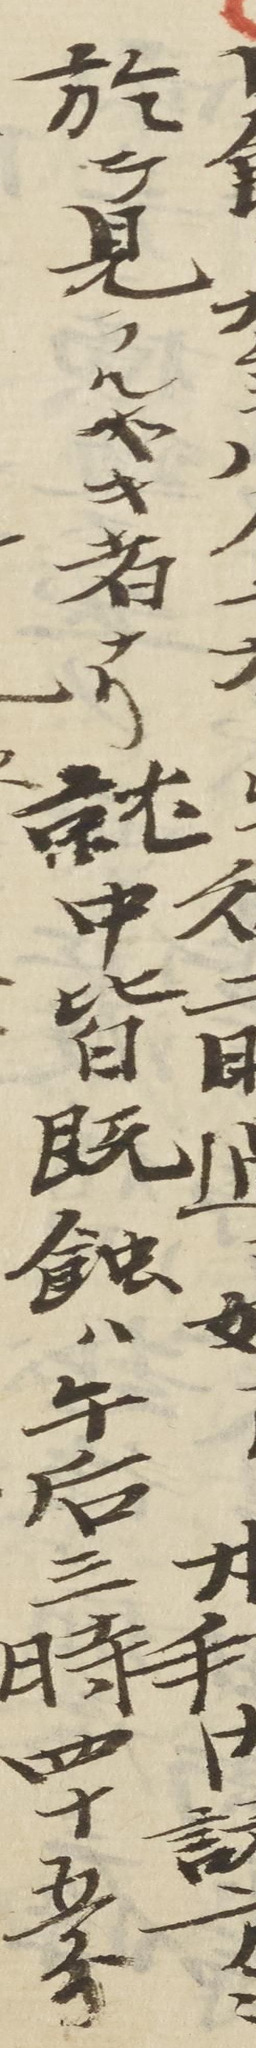於テ見ラルベキ者ナリ就中皆既蝕ハ午后三時四十五分
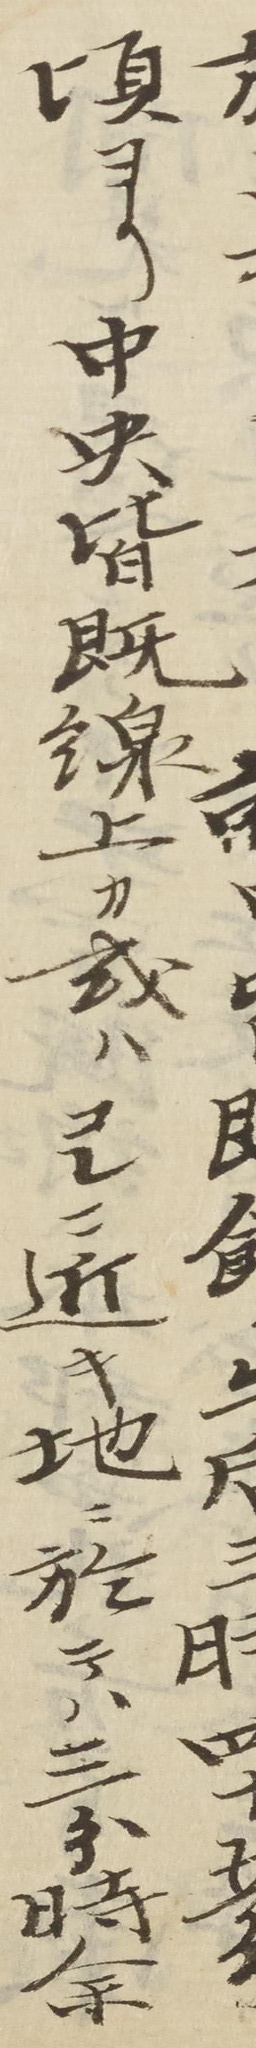頃ヨリ中央皆既線上カ或ハコレニ近キ地ニ於テハ三分余

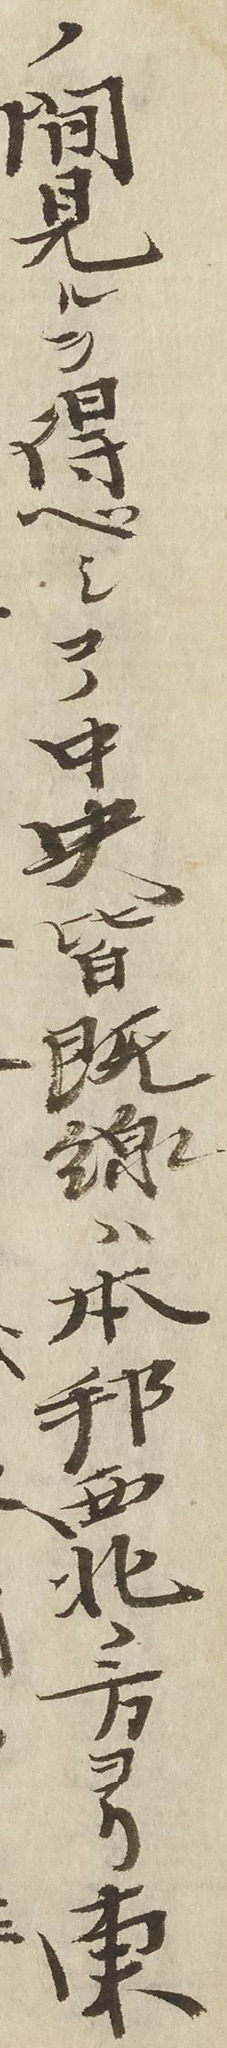ノ間見ルヲ得ベシコノ中央皆既線ハ本邦西北ノ方ヨリ東
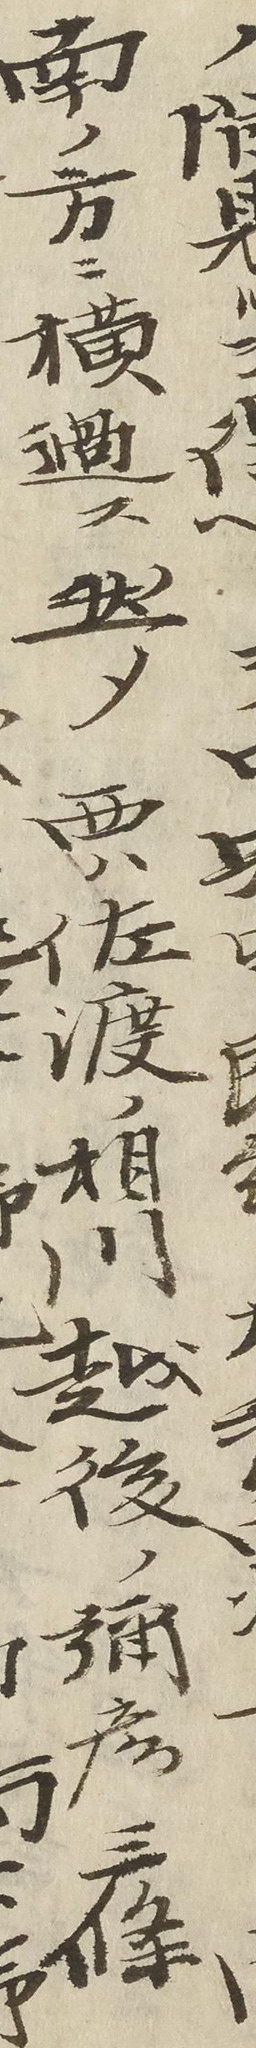南ノ方ニ横過ス然シテ西ハ佐渡ノ相川越後ノ弥彦三條
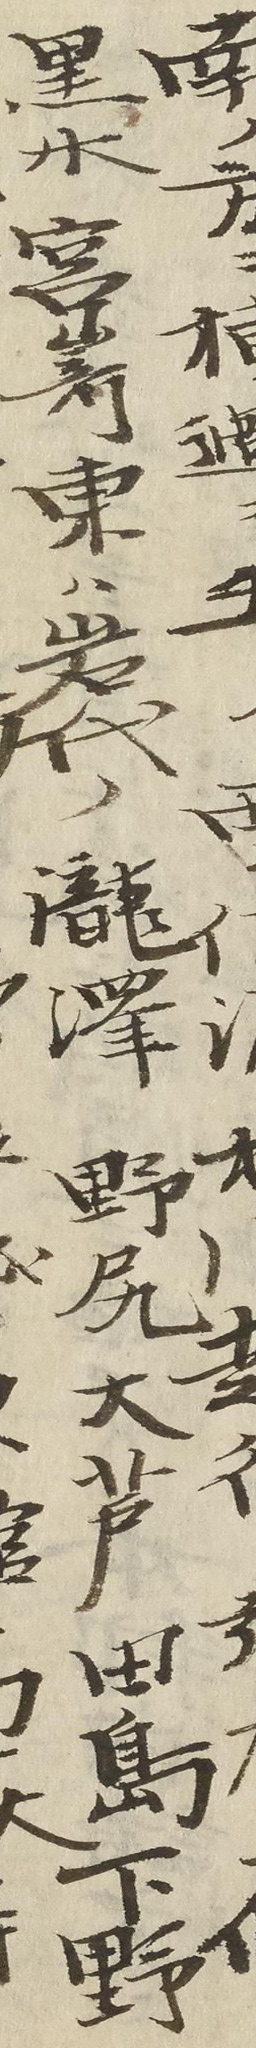黒木宮嵜東ハ岩代ノ滝沢野尻大芦田島下野
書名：日蝕録　全
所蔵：東京大学地震研究所図書室 Earthquake Research Institute Library, The University of Tokyo, JAPAN
